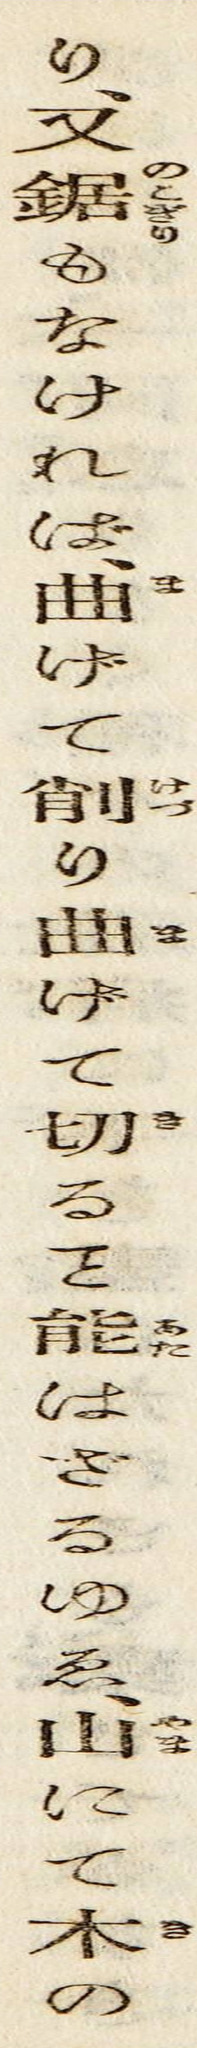り、又鋸もなければ、曲げて削り曲げて切ること能はざるゆゑ、山にて木の
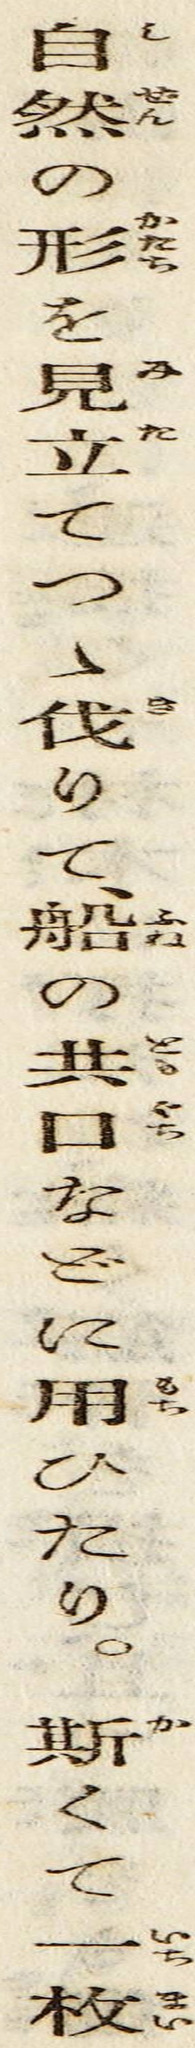自然の形を見立てつゝ伐りて、船の共口などに用ひたり。斯くて一枚
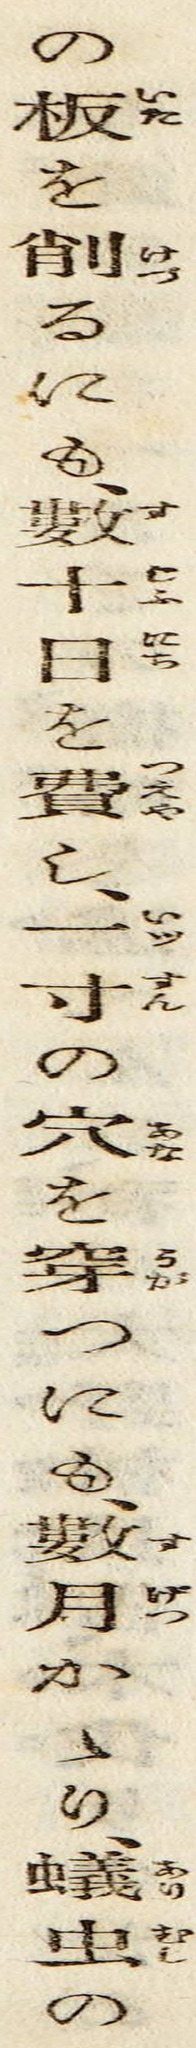の板を削るにも、数十日を費し、一寸の穴を穿つにも、数月かゝり、蟻虫の
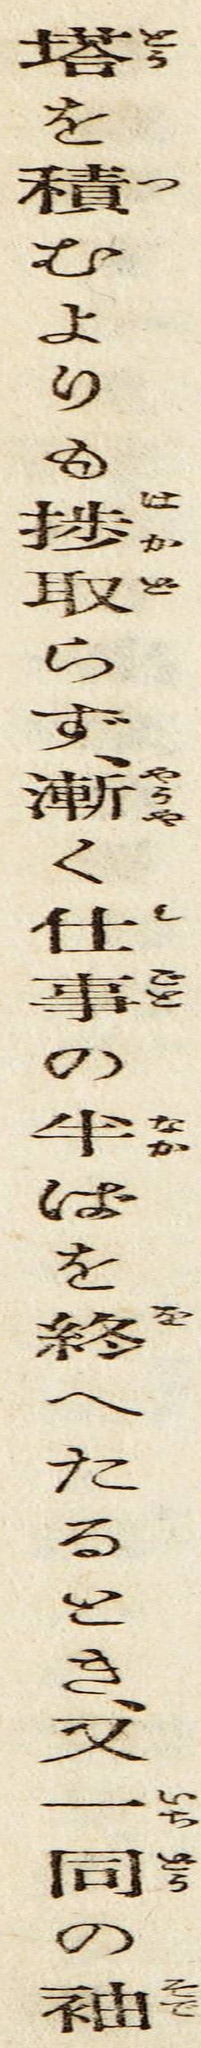塔を積むよりも捗取らず、漸く仕事の半ばを終へたるとき、又一同の袖

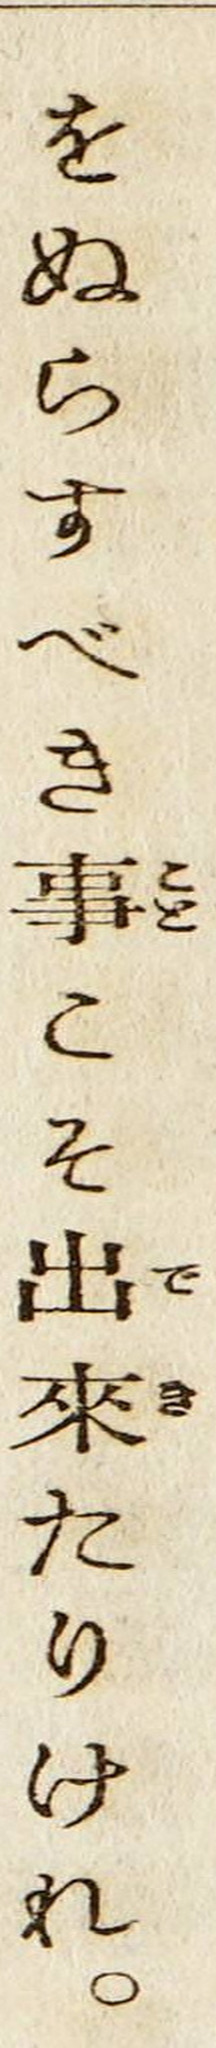をぬらすべき事こそ出来たりけれ。
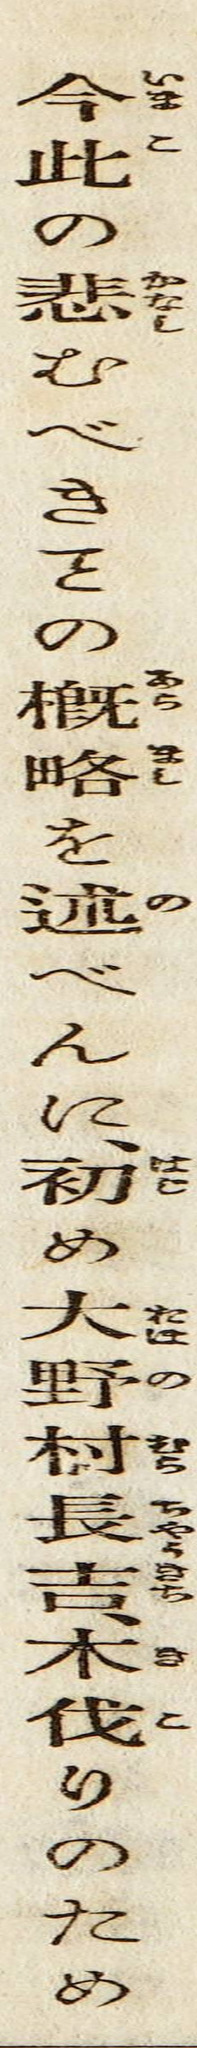今此の悲むべきことの概略を述べんに、初め大野村長吉、木伐りのため
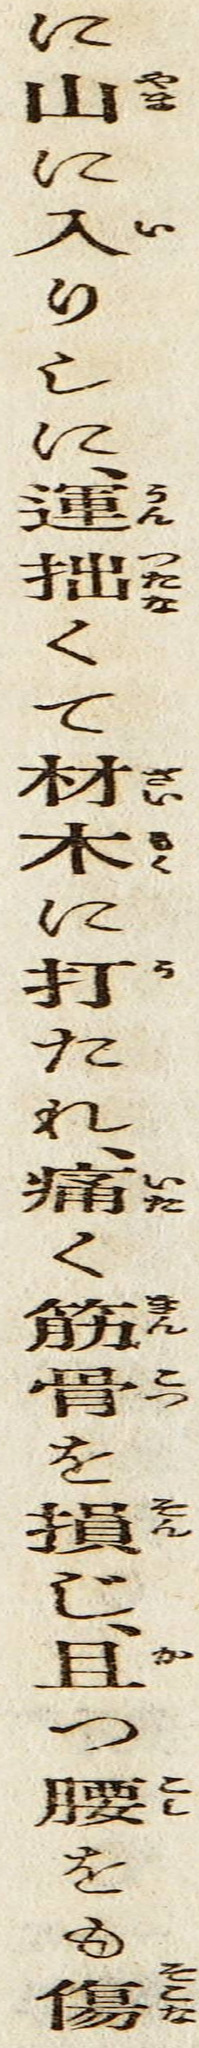に山に入りしに、運拙くて材木に打たれ、痛く筋骨を損じ、且つ腰をも傷
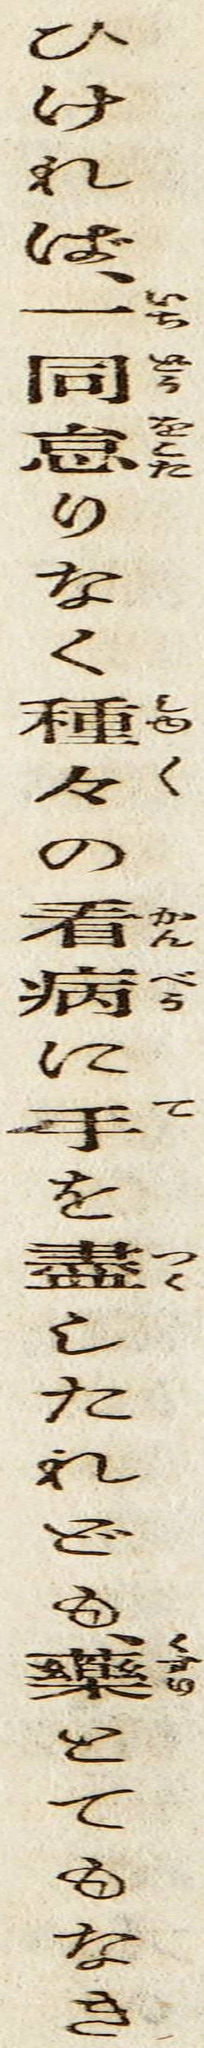ひければ、一同怠りなく種々の看病に手を尽したれども、薬とてもなき
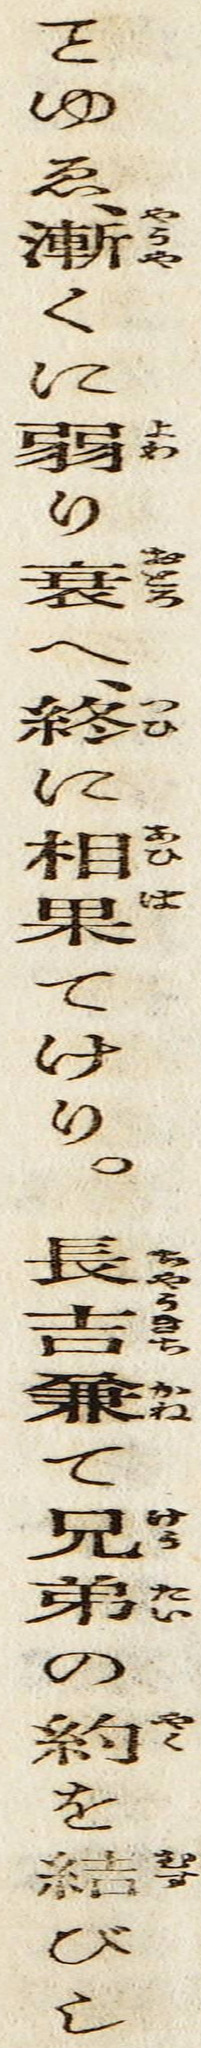ことゆゑ、漸くに弱り衰へ、終に相果てけり。長吉兼て兄弟の約を結びし
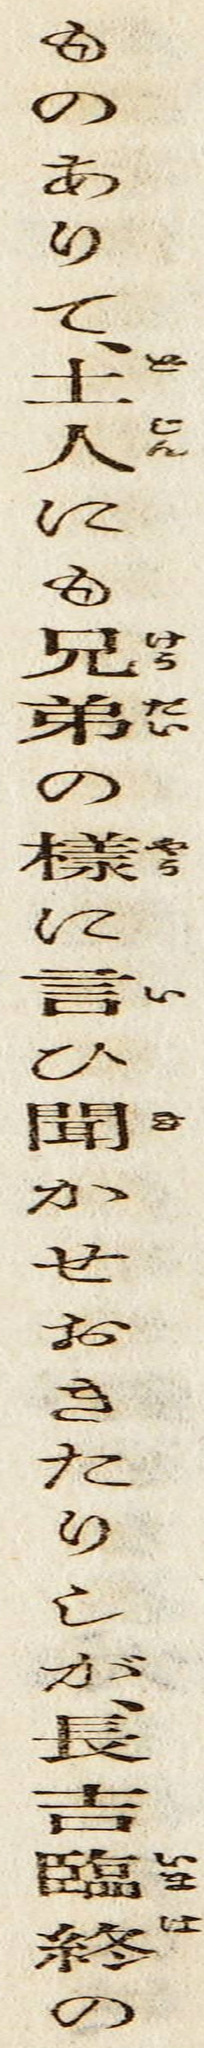ものありて、土人にも兄弟の様に言ひ聞かせおきたりしが、長吉臨終の
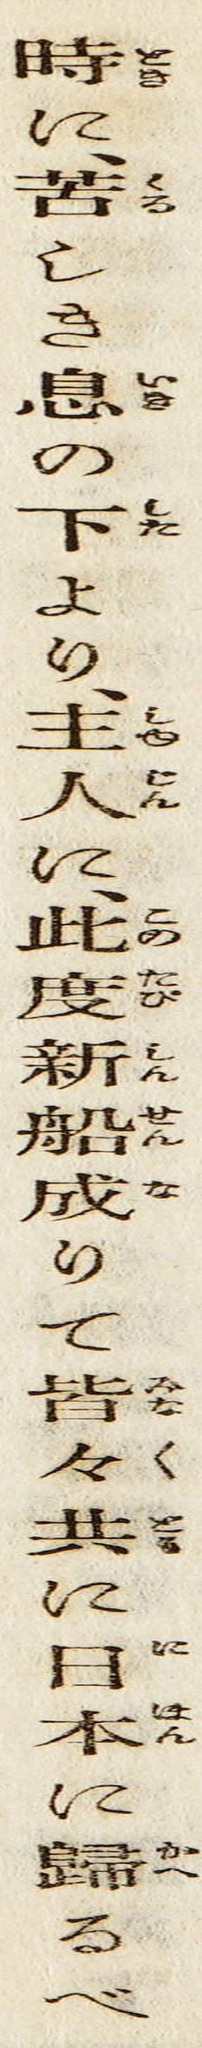時に、苦しき息の下より、主人に、此度新船成りて皆々共に日本に帰るべ
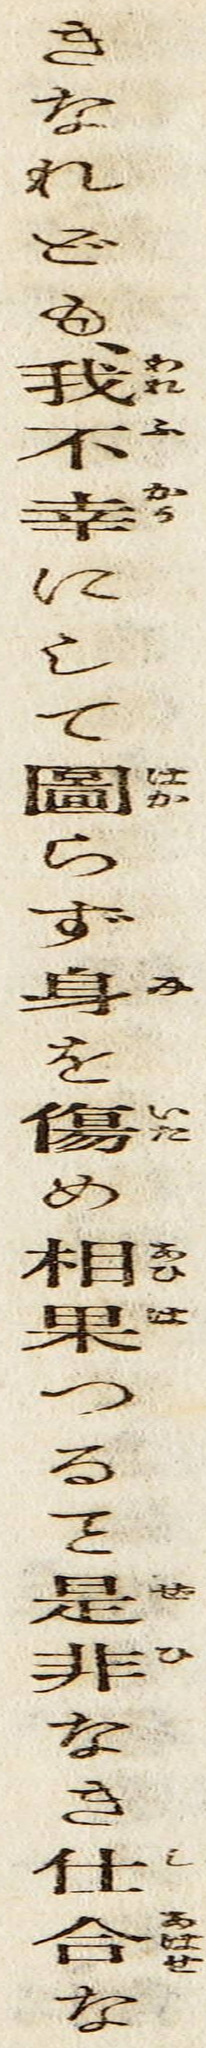きなれども、我不幸にして図らず身を傷め相果つること是非なき仕合な
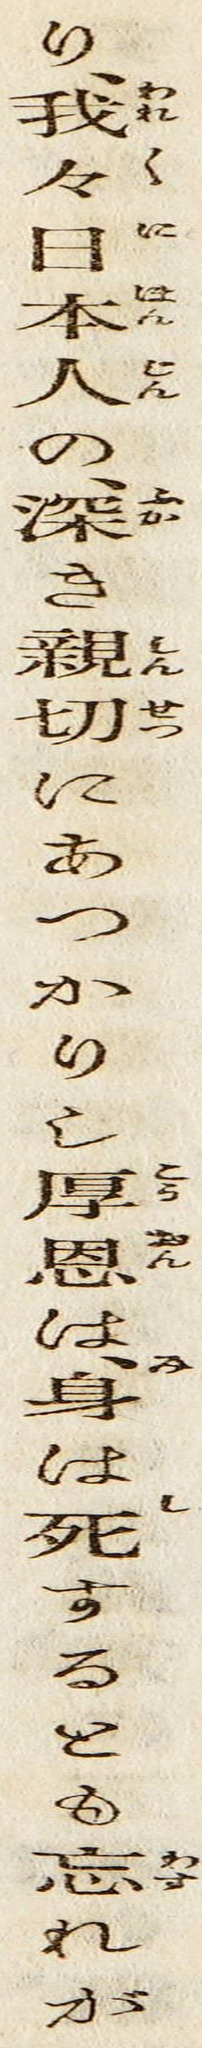り、我々日本人の、深き親切にあつかりし厚恩は、身は死するとも忘れが
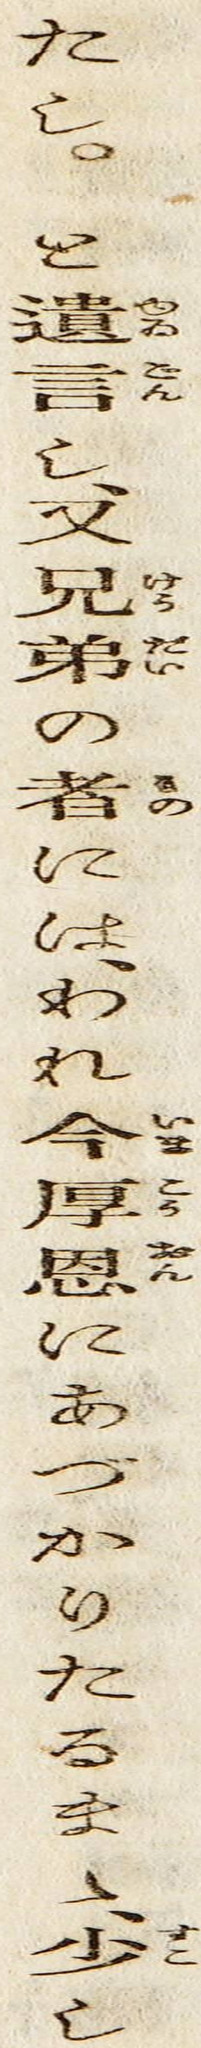たし。と遺言し、又兄弟の者には、われ今厚恩にあづかりたるまゝ、少し
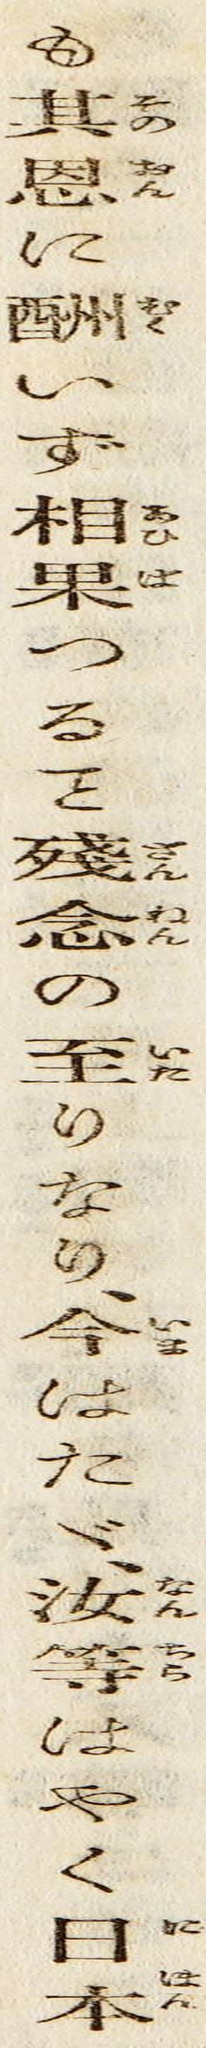も其恩に酬いず相果つること残念の至りなり、今はたヾ、汝等はやく日本
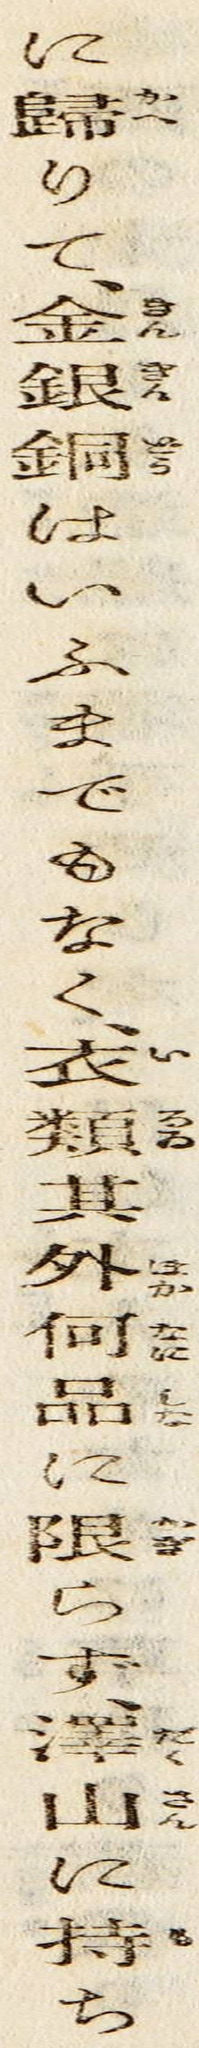に帰りて、金銀銅はいふまでもなく、衣類其外何品に限らず、沢山に持ち
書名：日本漂流譚
